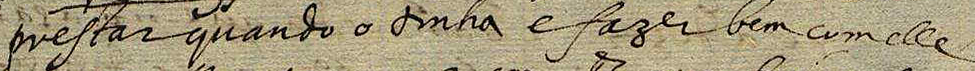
prestar quando o tinha e fazer bem com elle
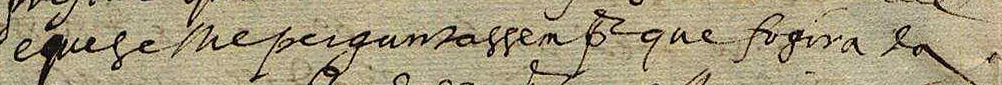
e que se lhe perguntassem porque fogira da
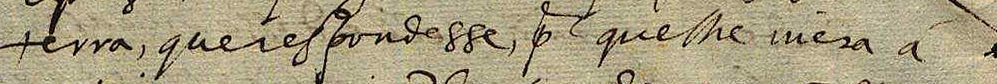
terra, que respondesse, porque lhe uiera a
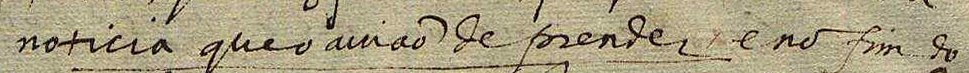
noticia que o auiaõ de prender, e no fim do
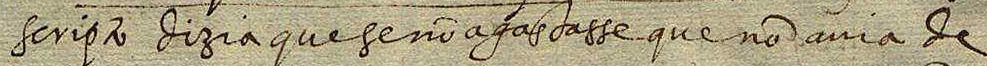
scripto dizia que se nō agastasse que nō auia de
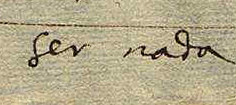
ser nada
